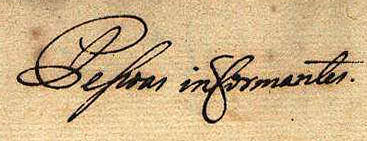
Pessoas informantes.
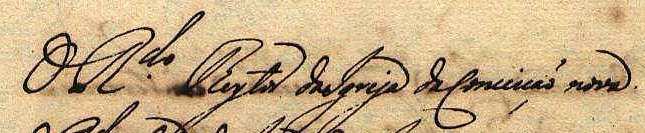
O R.do Reytor da Igreja da Conceiçaõ nova.
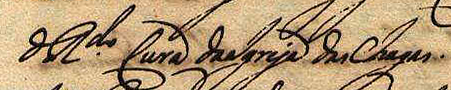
O R.do Cura da Igreja das Chagas.
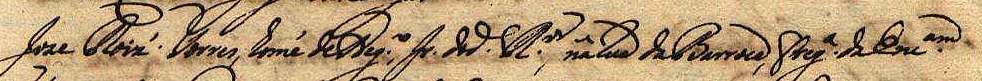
Joze Roiz̄ Torres homē de Reg.o, Jr. do d.o R.or, na Rua da Barroca, freg.a da Enca.m
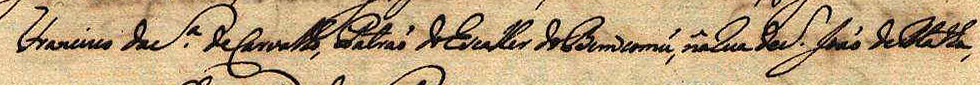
Francisco da S.a de Carvallo, Patraõ do Escaller do Bem comū, na Rua de S. Joaõ de Matha,
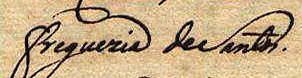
freguezia de Santos.
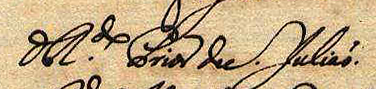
o R.do Prior de S. Juliaõ.
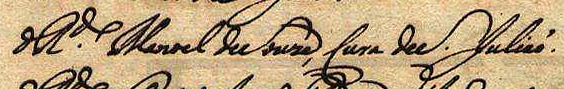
o R.do Manoel de Souza, Cura de S. Juliaõ.
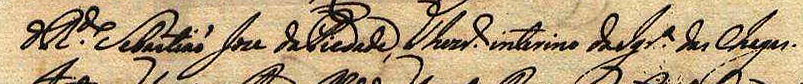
o R.do Sebastiaõ Joze da Piedade, Thezr.o interino da Igr.a das Chagas
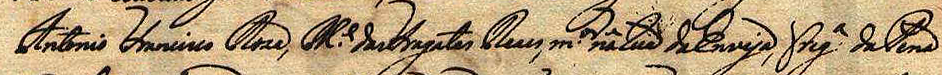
Antonio Francisco Roza, M.l das Fragatas Reaes, m.or na Rua da Enveja, freg.a da Pena.
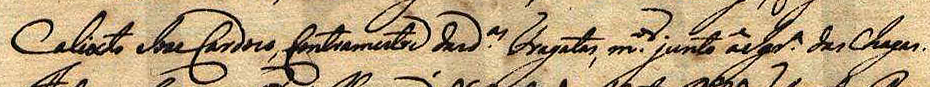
Calixto Ioze Cardozo, Contramestre das d.as Fragatas, m.or junto a Igr.a das Chagas.
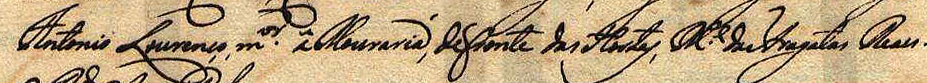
Antonio Lourenço, m.or a Mouraria, defronte das Hortas, M.l da Fragatas Reaes.
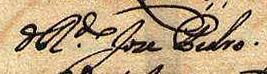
o R.do Joze Pedro.
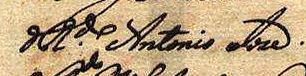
o R.do Antonio Ioze.
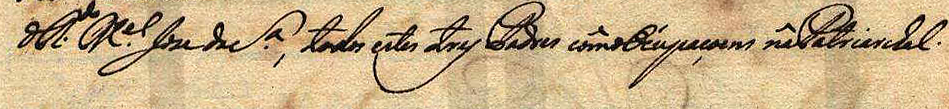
o R.do M.el Joze da S.a, todos estes tres Padres como Ocupaçoens na Patriarchal.
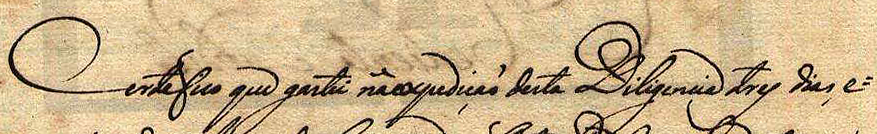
Certefico que gastei na expediçaõ desta Diligencia tres dias, e
